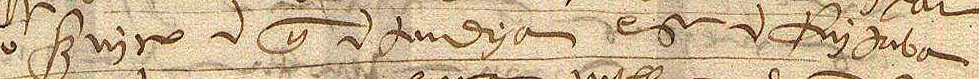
o ꞩuyço ē q̄ ētendya e se ēfeytava
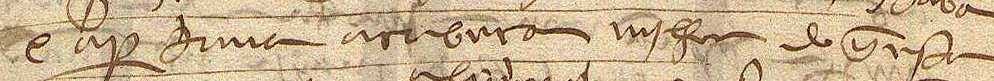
e aꝑtaua a cabeça mjlhor do q̄ esta
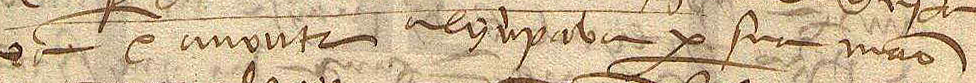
va e a noute alynpava ꝑ sua mão
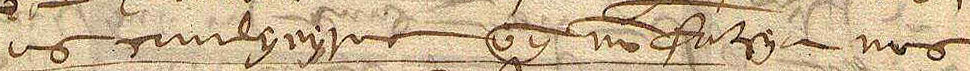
os candyeyros o q̄ n̄o fazya nos
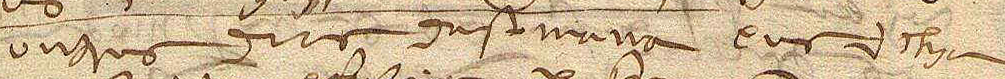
outros dias da somana e os ēchya
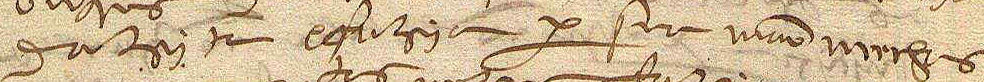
dazeyte e fazya ꝑ sua mão mechas
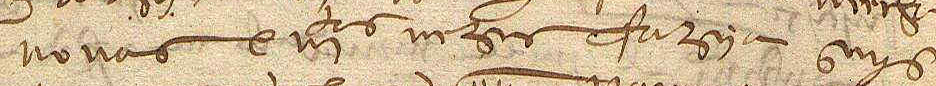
nouas e mtas uezes fazya seys
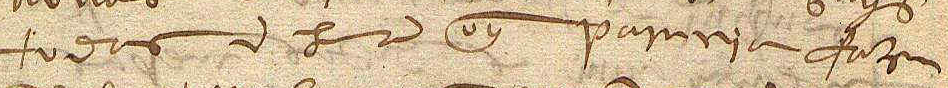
todas ē huā o q̄ parecya fazer
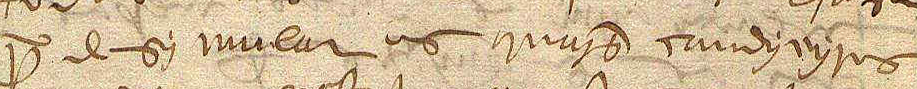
p̄o desymular os quajs candyeyros
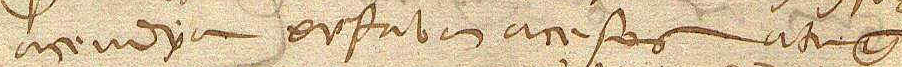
acendya e estavan acesos ate q̄
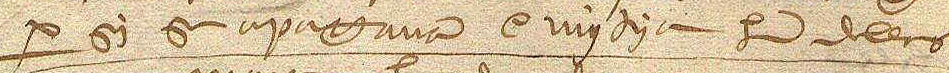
ꝑ sy se apagauā e mytya hū delles
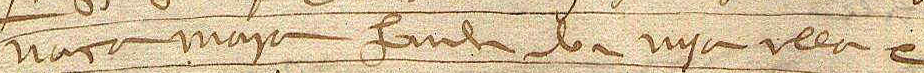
na camara honde dormja ella e
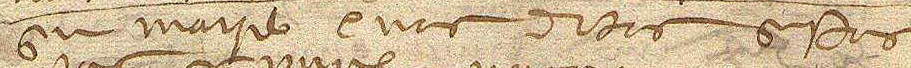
seu marjdo e nas ditas sestas
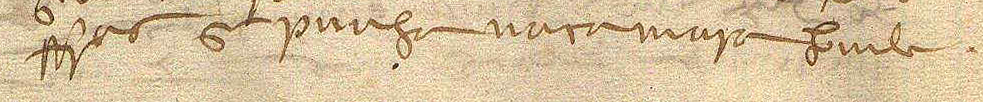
ffras se punha na camara honde
